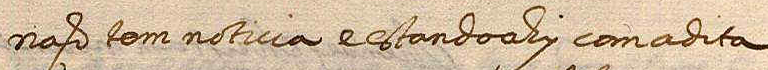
naõ tem noticia e estando ahy com a dita
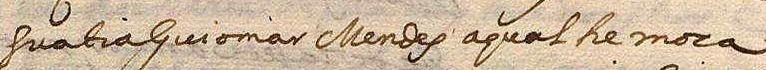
sua tia Guiomar Mendes a quaL he mora
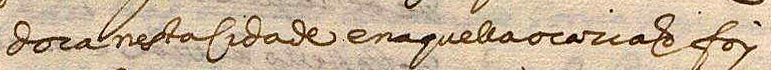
dora nesta Cidade e naquella ocaziaõ foy
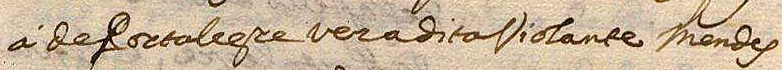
á de Portalegre ver a dita Violante Mendes
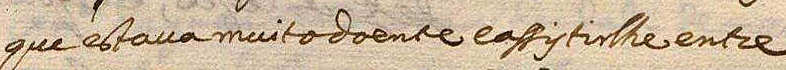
que estaua muito doente e assistirlhe entre
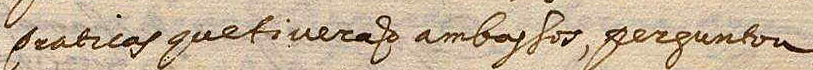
praticas que tiueraõ ambas sos, perguntou
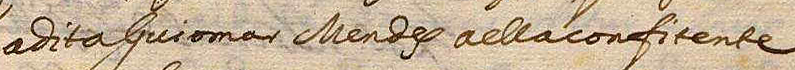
a dita Guiomar Mendes a ella confitente
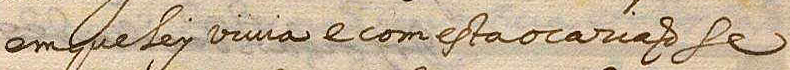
em que Ley viuia e com esta ocaziaõ se
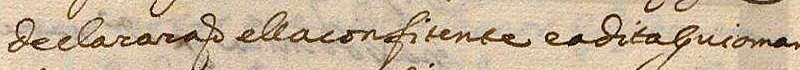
declararaõ ella confitente e a dita Guiomar
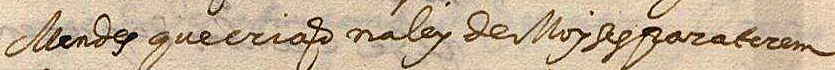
Mendes que criaõ na ley de Moyses para terem
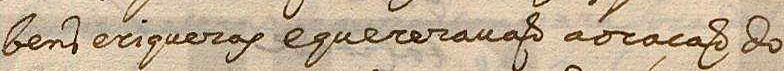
bens e riquezas e que rezauaõ a oraçaõ do
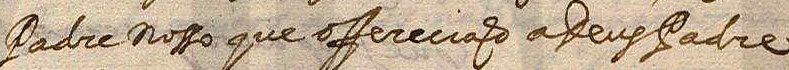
Padre nosso que offereciaõ a Deus Padre
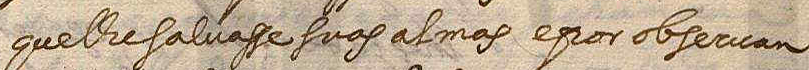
que lhe saluasse suas aLmas e por obseruan
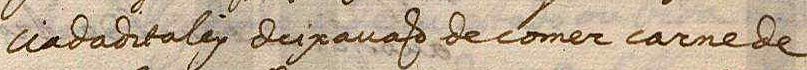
cia da dita ley deixauaõ de comer carne de
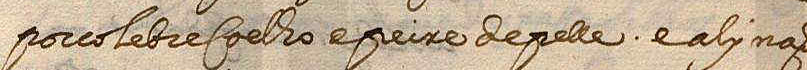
porco Lebre Coelho e peixe de pelle. e aly naõ
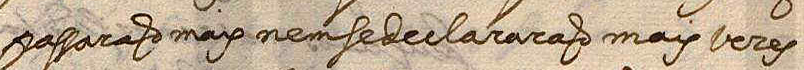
passaraõ mais nem se declararaõ mais vezes
